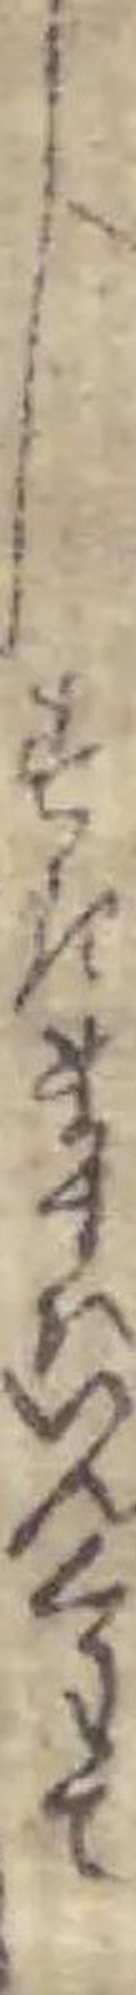すきますはいんくわて
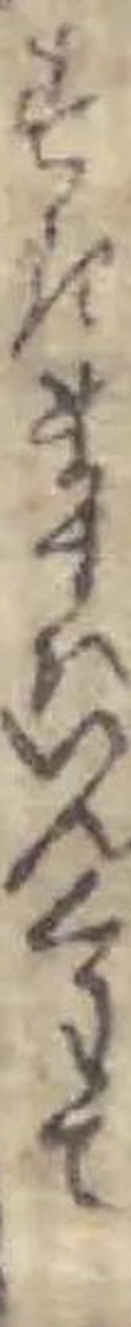すきますはいんくわて
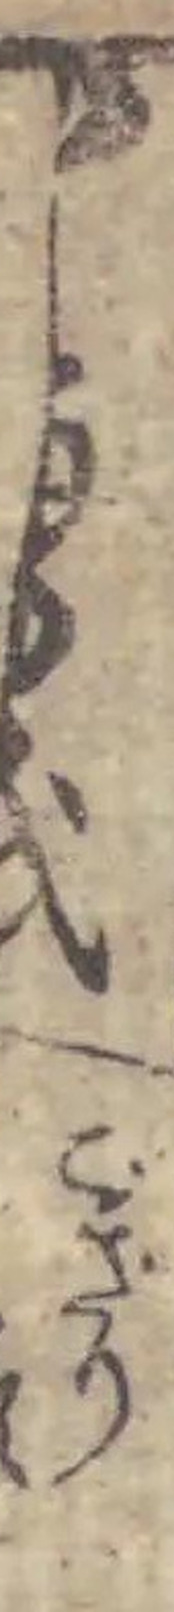ござり
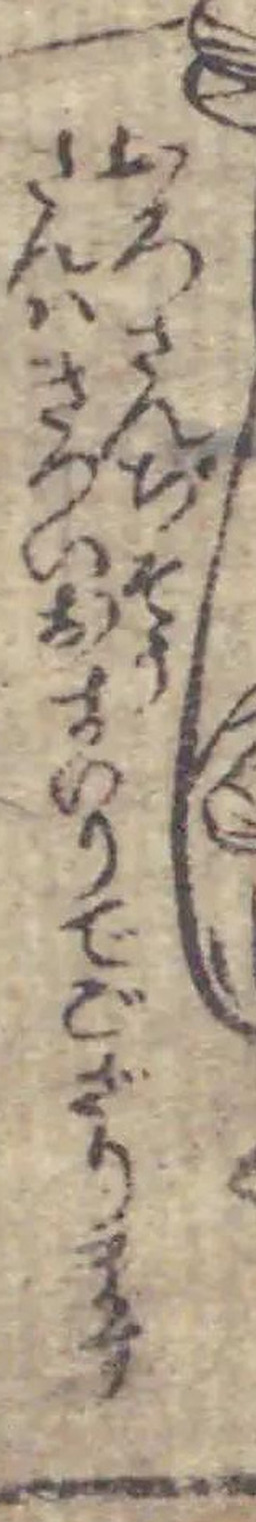さんはきついおまいりでござります
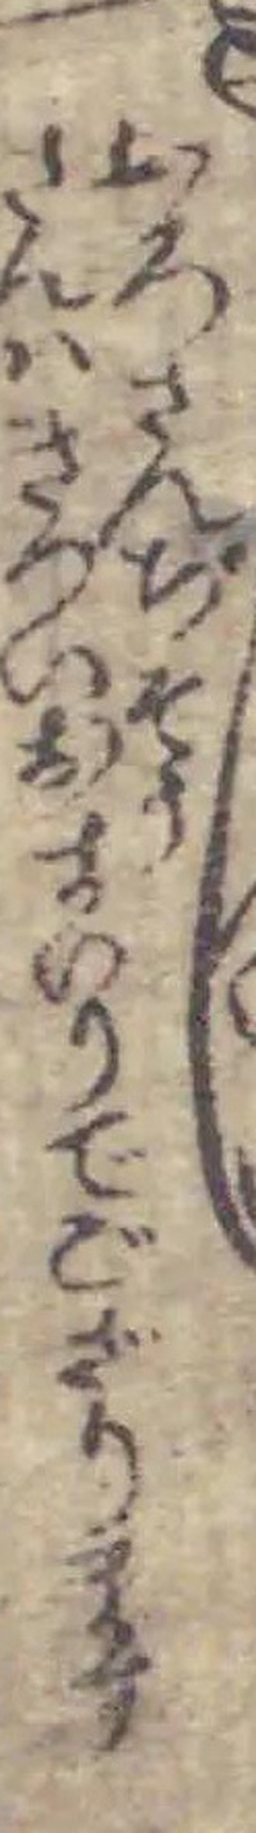さんはきついおまいりでござります
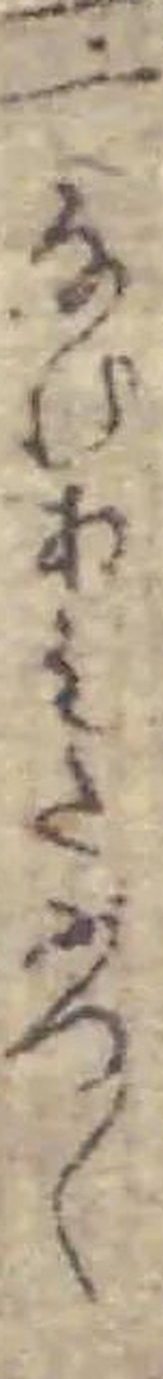なむあみたふつ〳〵

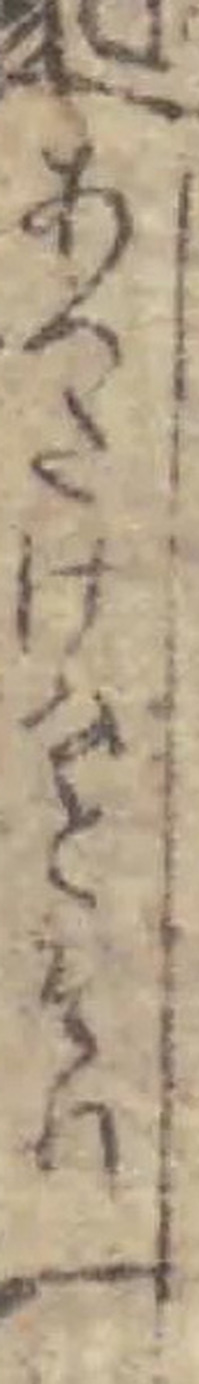あつたけなとそれ
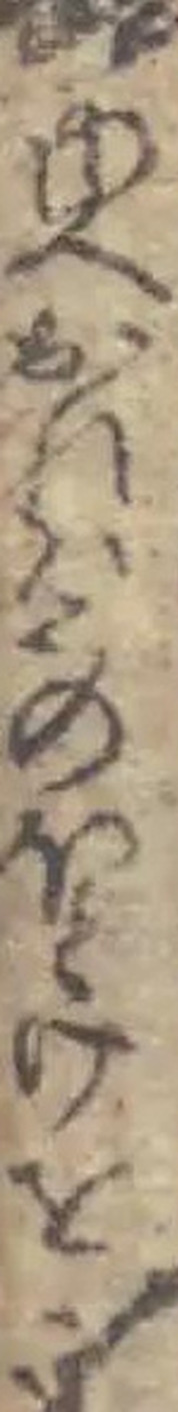ゆへおれはこのほとけを
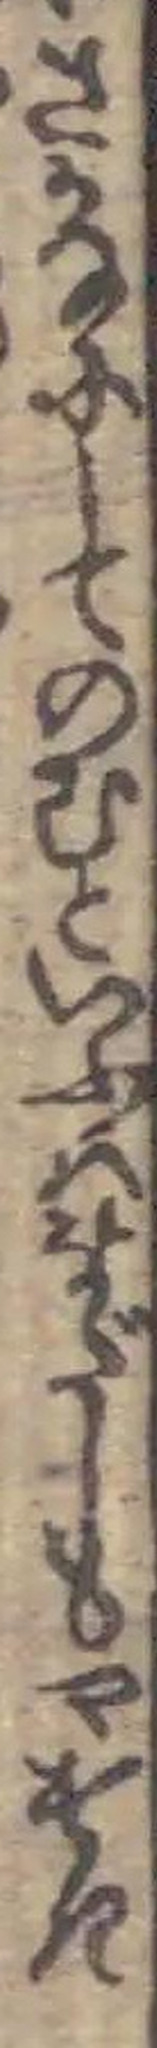さかなにしてのむといふはまだしもやすき
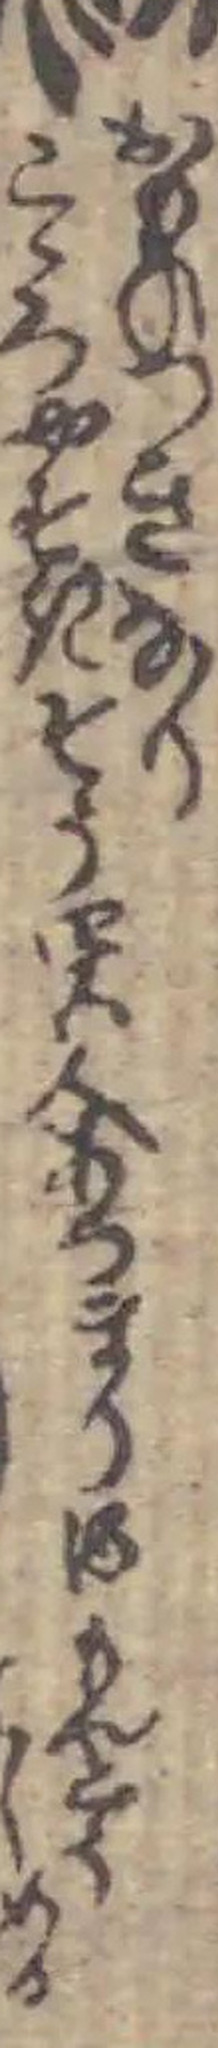こゝろやすきそう四五人あつまり酒もんとう
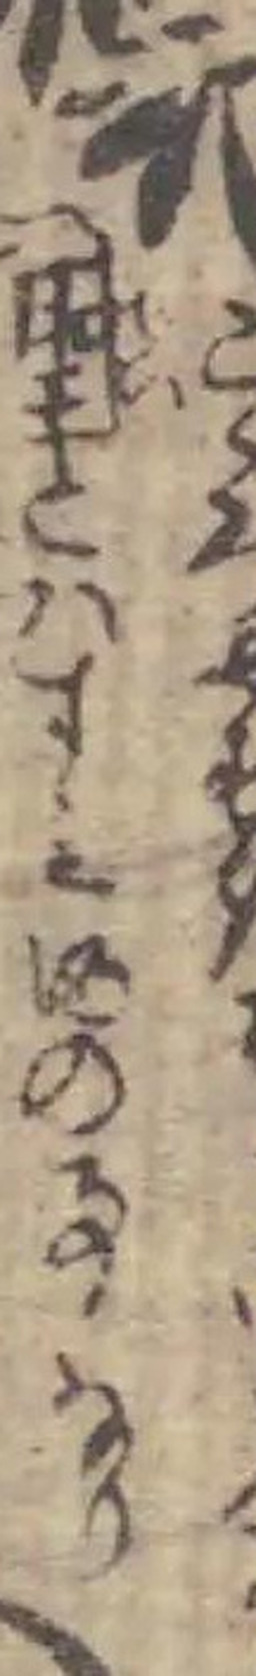「聖とはすみ酒の事なり
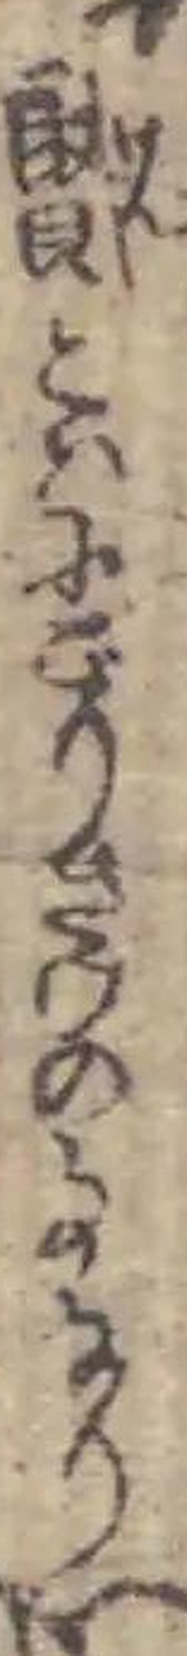「賢とはにごりさけの事なり
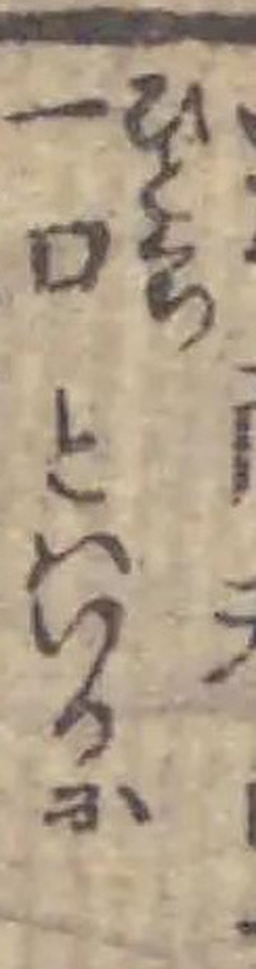一口とはいかに
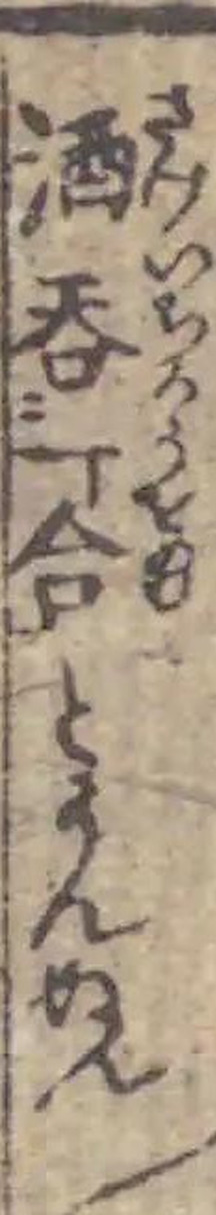酒呑一合とうんぬん

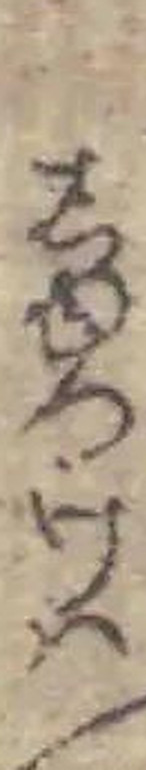しゆつけは
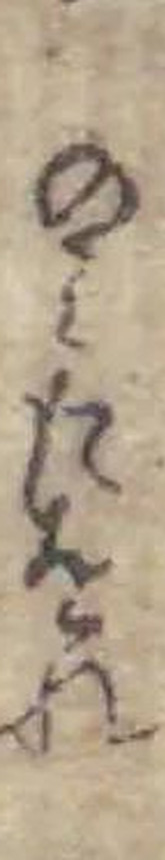のみたをれ
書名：飲中八人前 3巻
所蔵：国立国会図書館 National Diet Library, JAPAN
